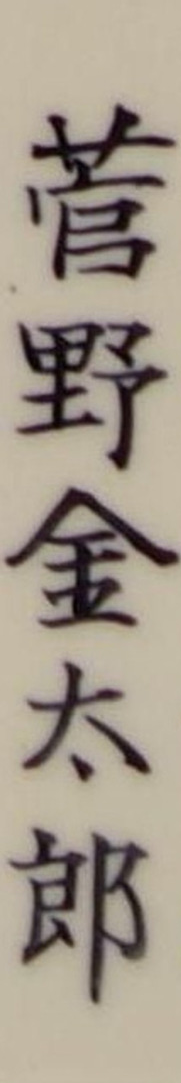菅野金太郎
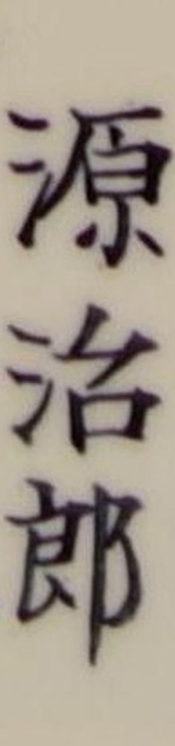源治郎
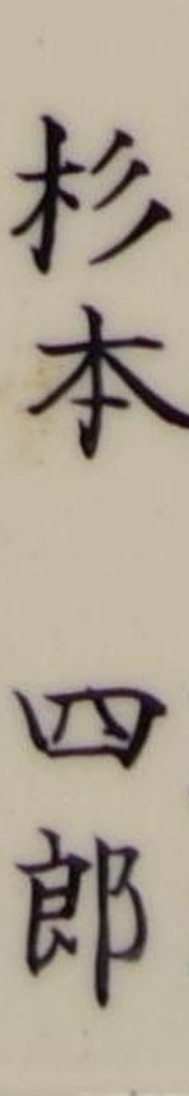杉本四郎
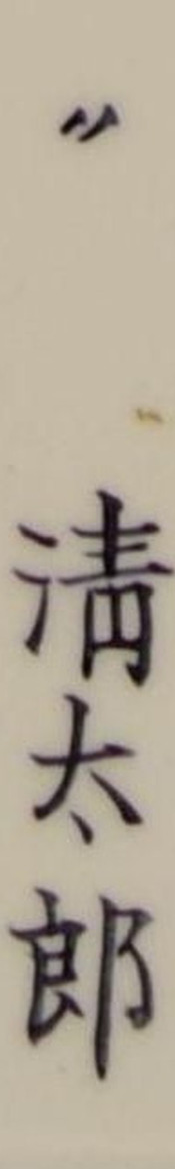清太郎
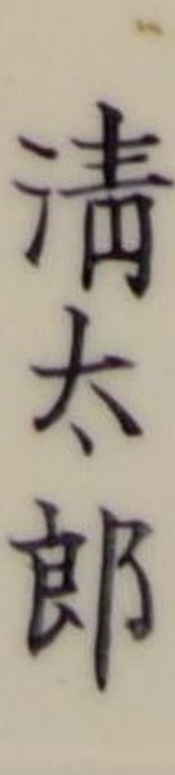清太郎
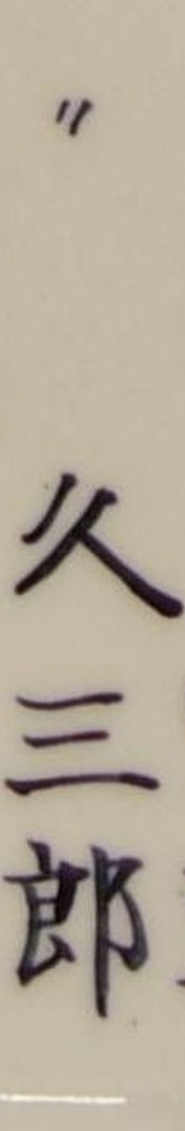久三郎
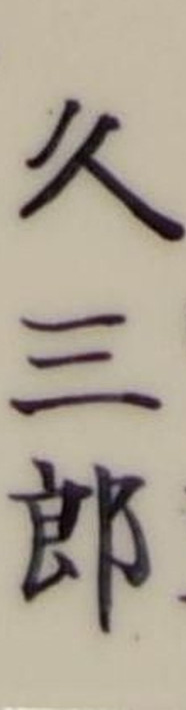久三郎

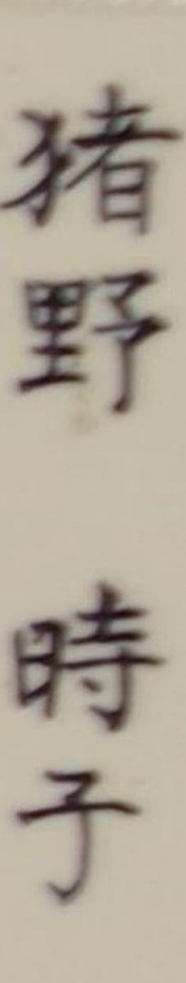猪野時子
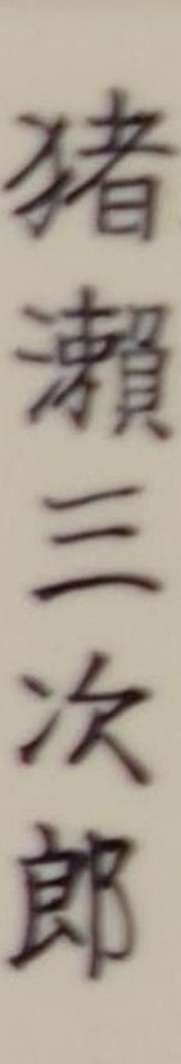猪瀬三次郎
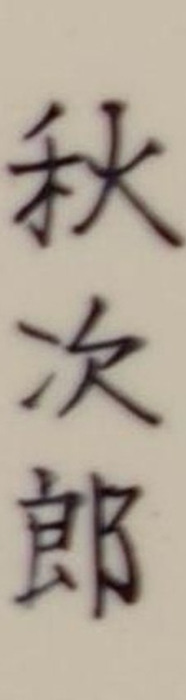秋次郎
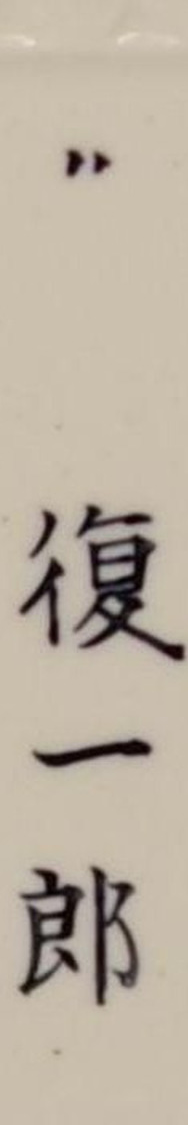復一郎
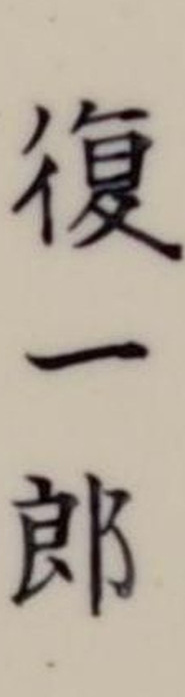復一郎
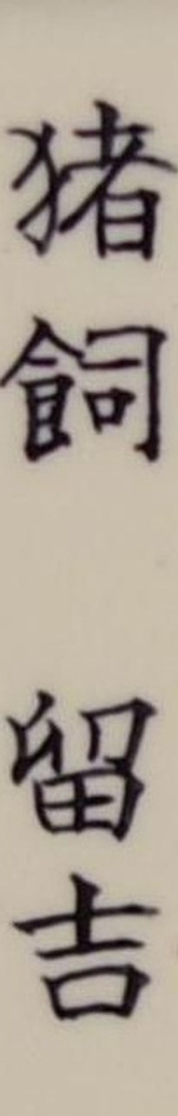猪飼留吉
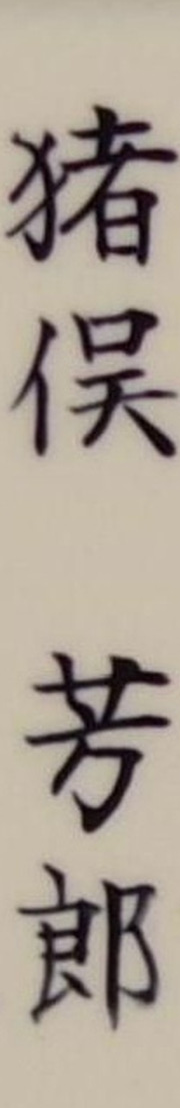猪俣芳郎
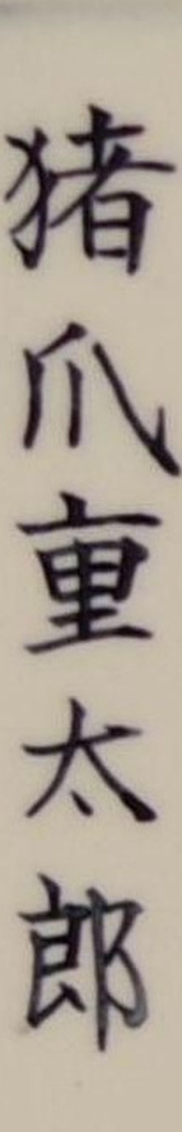猪爪重太郎
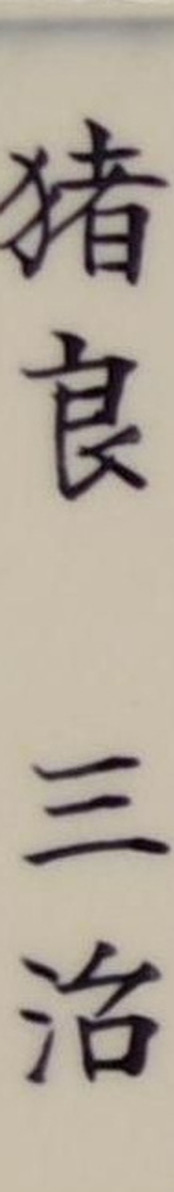猪良三治
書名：M~S
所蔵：高野山金剛峯寺
